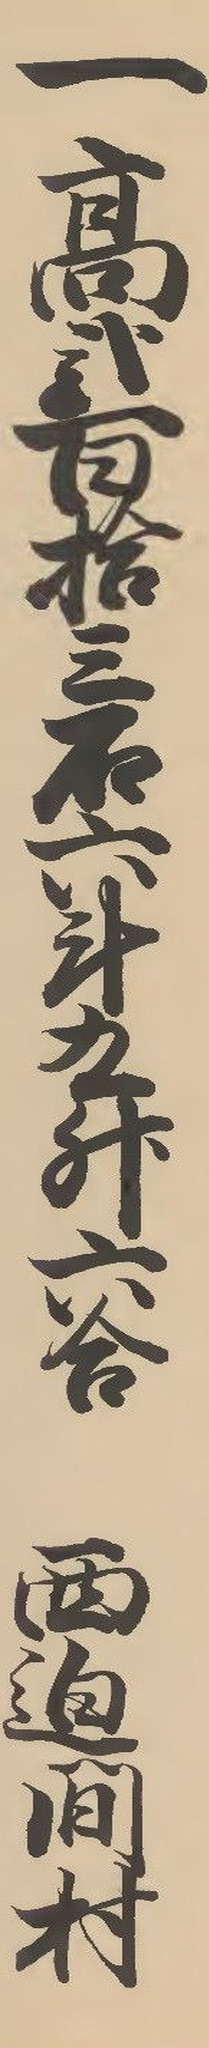一髙弐百拾三石六斗九升六合西迫間村
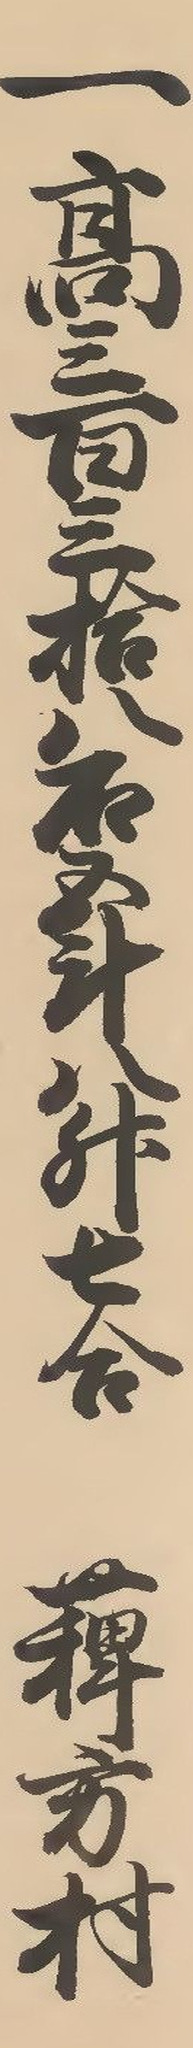一髙三百三拾八石五斗八升七合方村
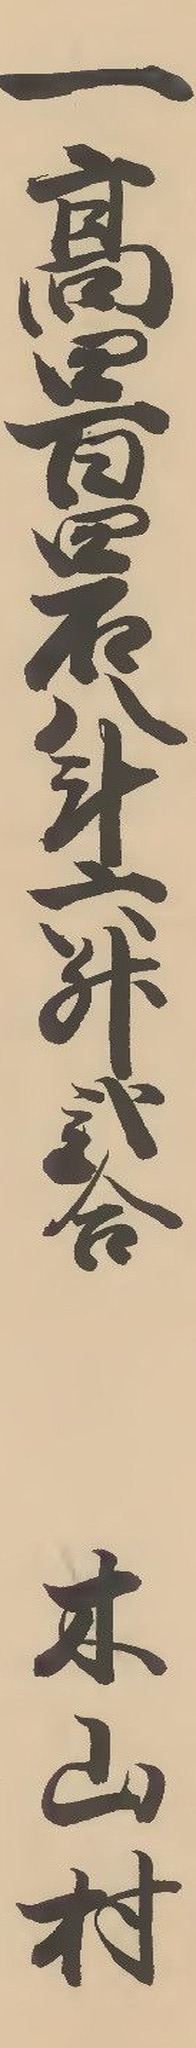一髙四百四石八斗六升弐合木山村
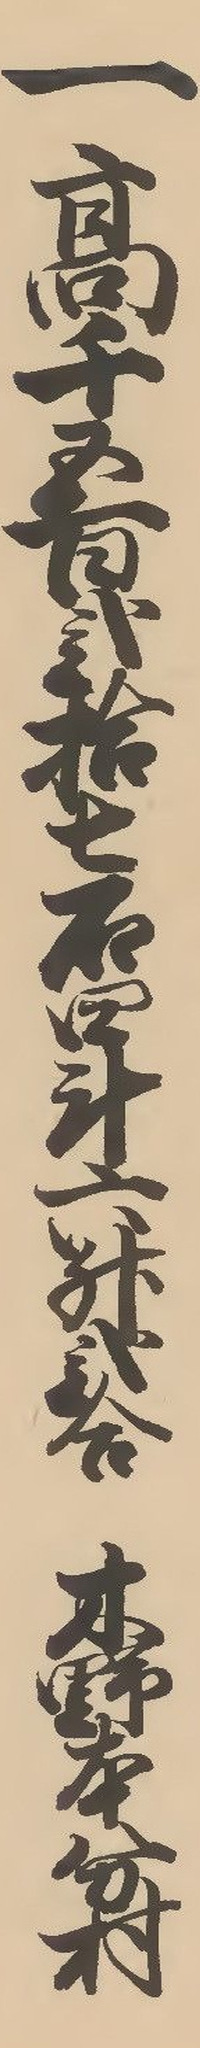一髙千五百弐拾七石四斗六升弐合木野本分村
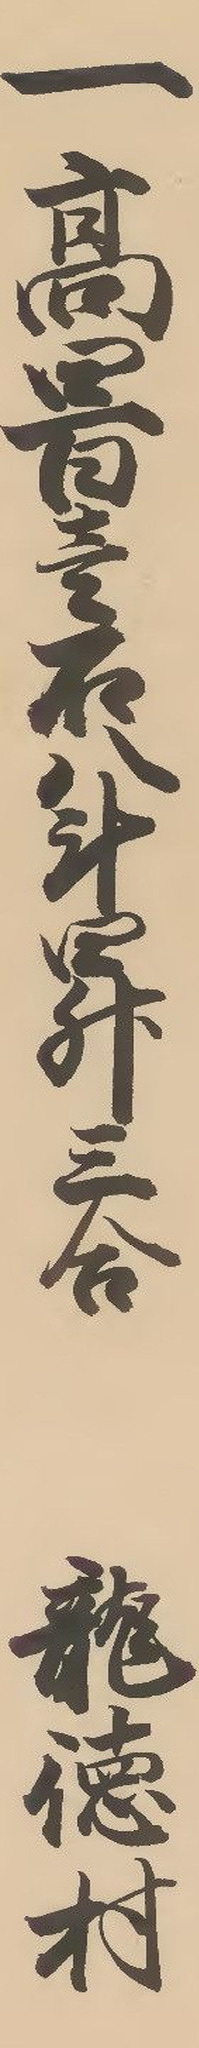一髙四百壱石八斗四升三合龍徳村

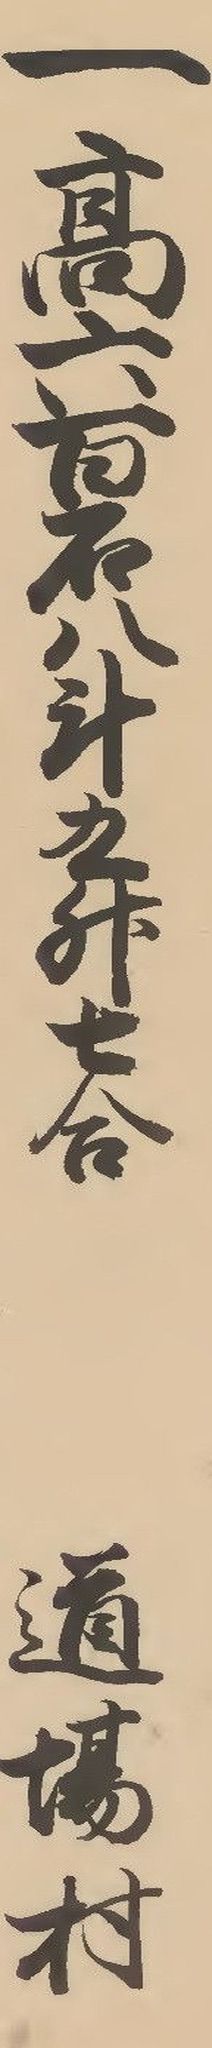一髙六百石八斗九升七合道場村
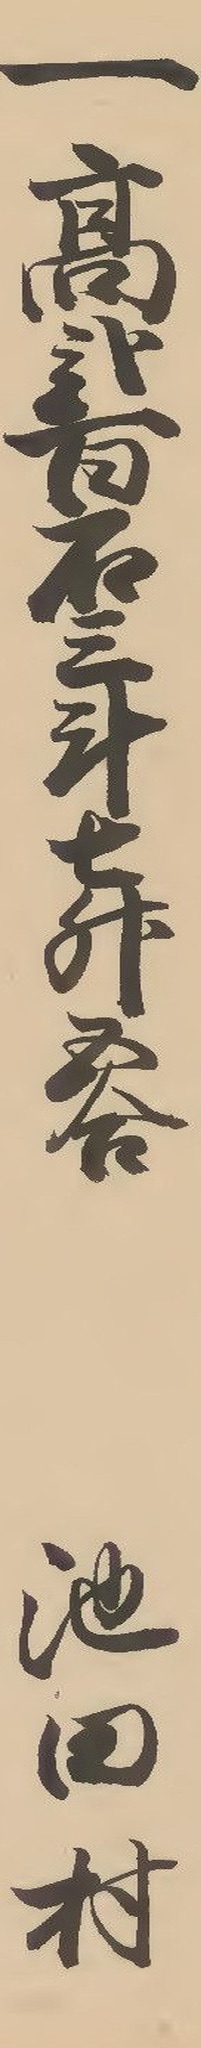一髙弐百石三斗七升五合池田村
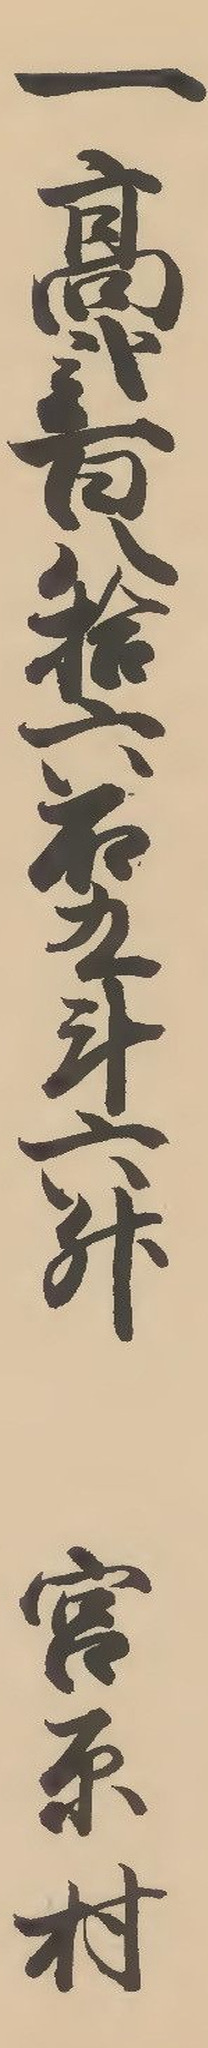一髙弐百八拾六石九斗六升宮原村
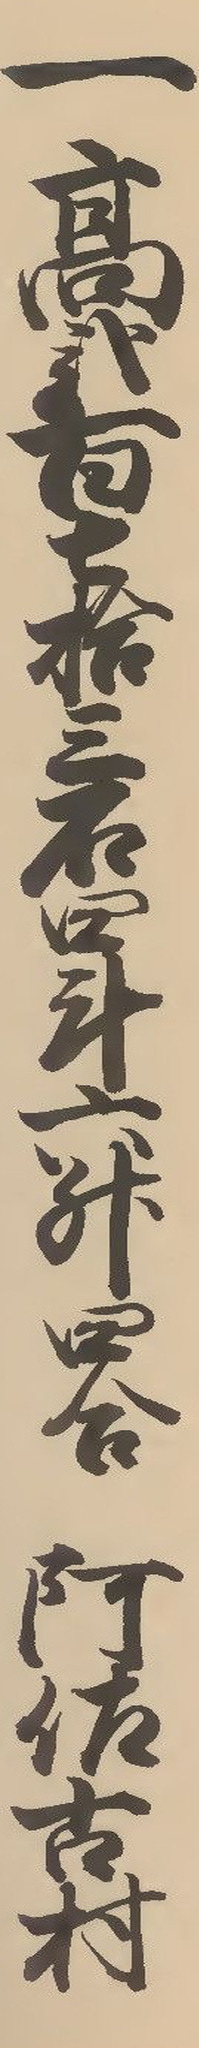一髙弐百七拾三石四斗六升四合阿佐古村
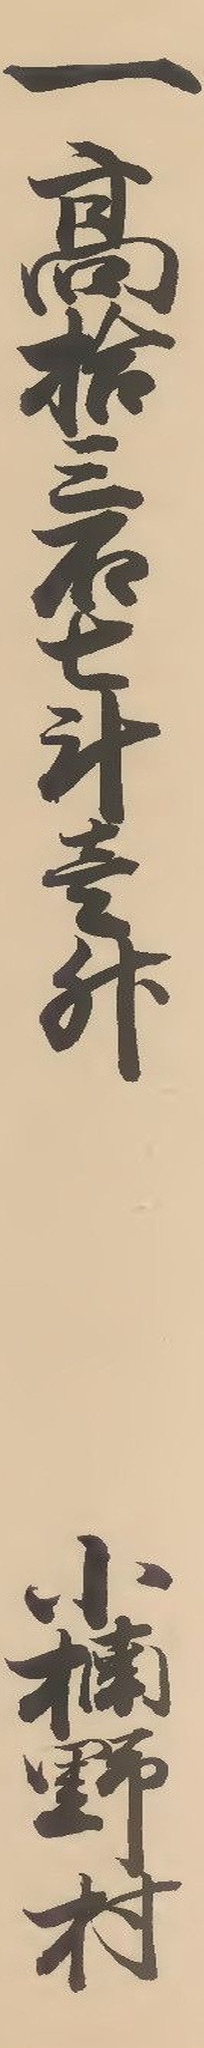一髙拾三石七斗壱升小楠野村
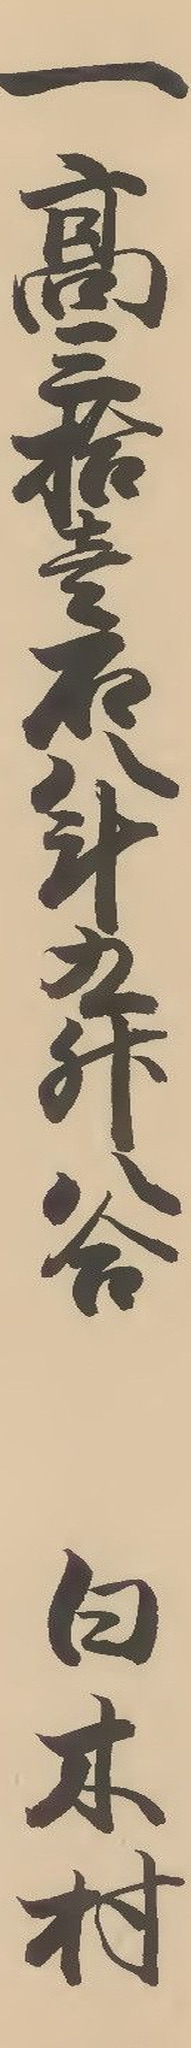一髙三拾壱石八斗九升八合白木村
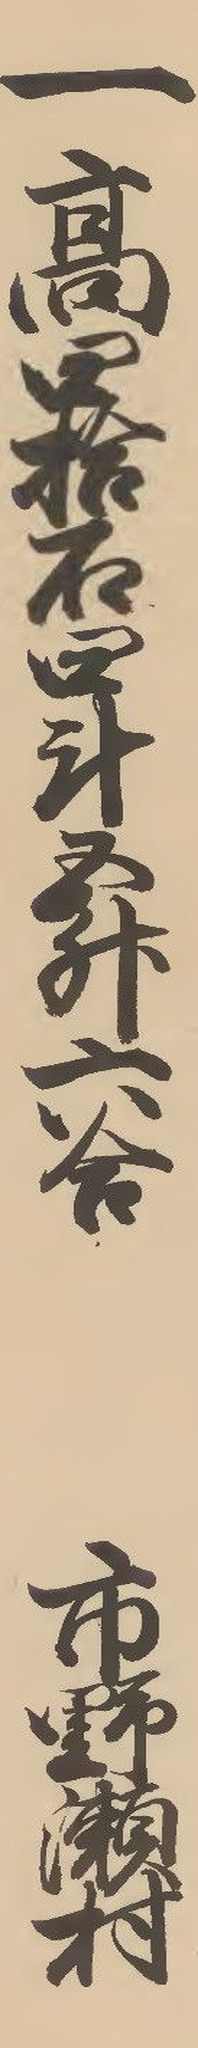一髙四拾石四斗五升六合市野瀬村
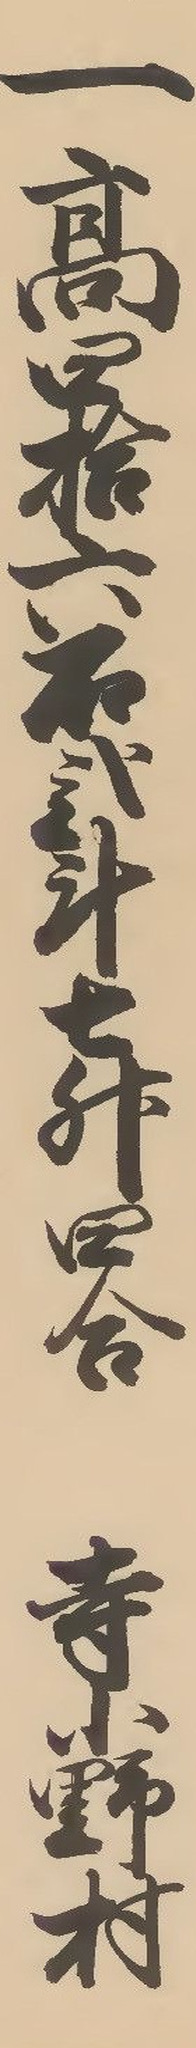一髙四拾六石弐斗七升四合寺小野村

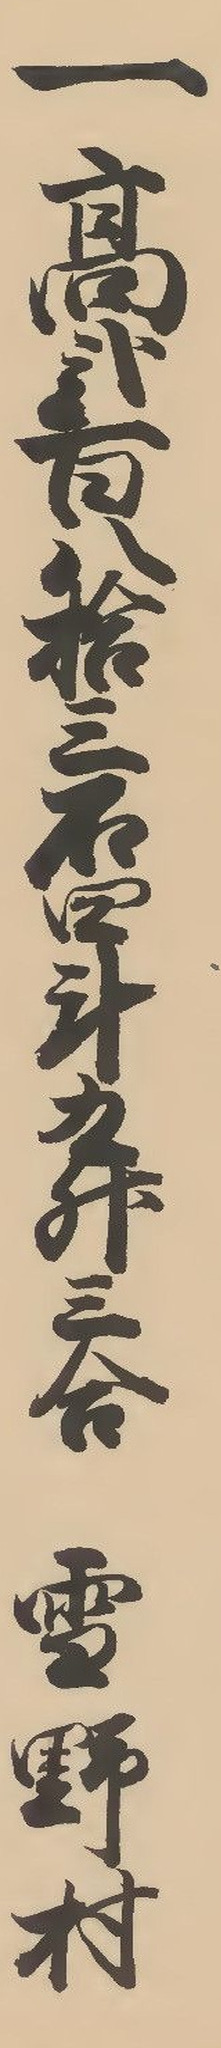一髙弐百八拾三石四斗九升三合雪野村
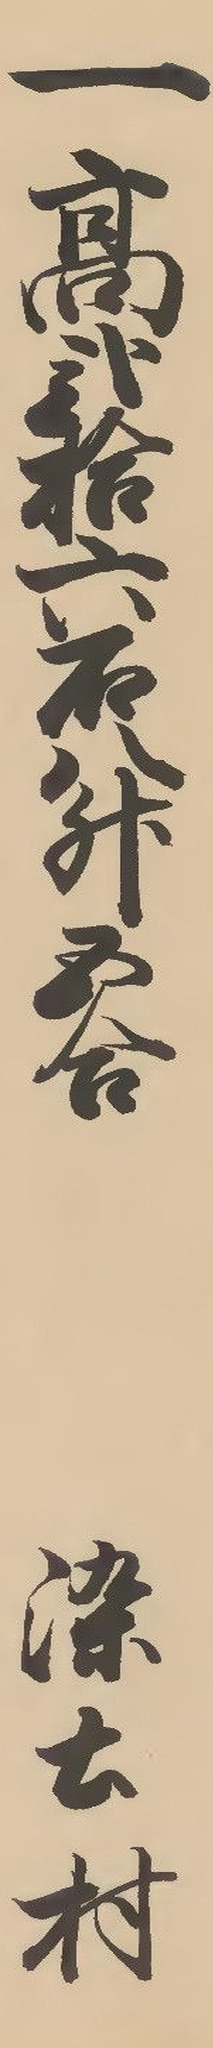一髙弐拾六石八斗五升染土村
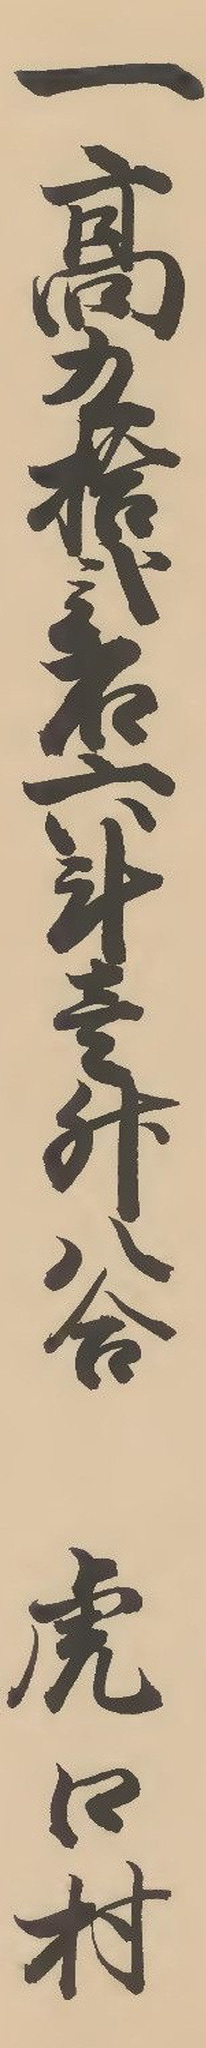一髙九拾弐石六斗壱升八合虎口村
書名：肥後国郷帳
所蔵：国立公文書館 National Archives of Japan
